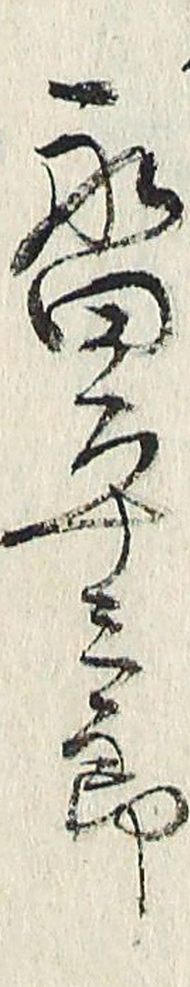永田平三郎
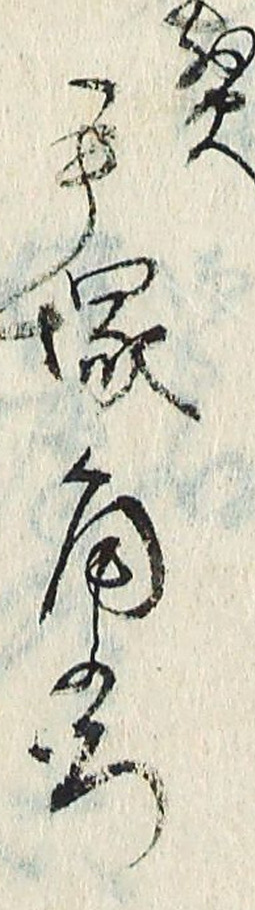手塚角右衛門
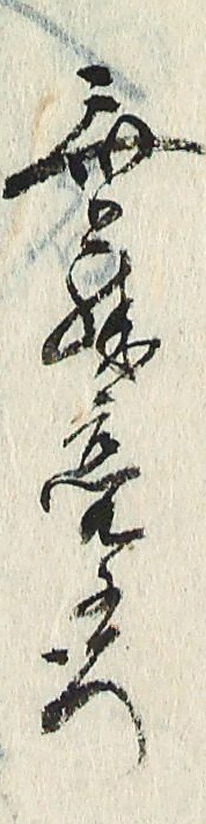斎藤亮右衛門
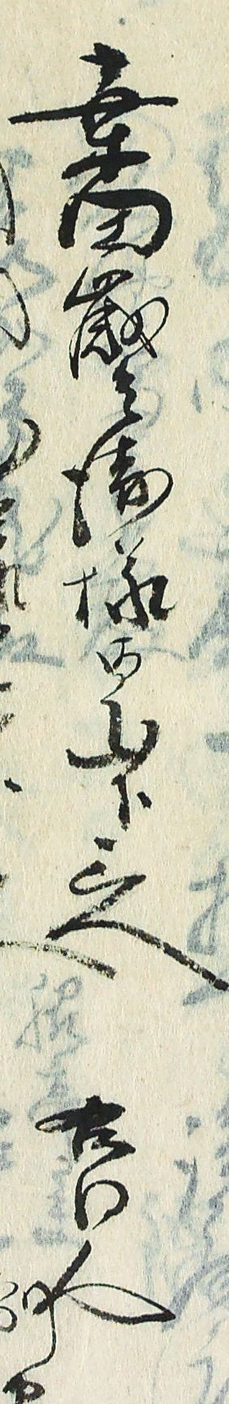桑田歳兵衛様御御上下三人右同人
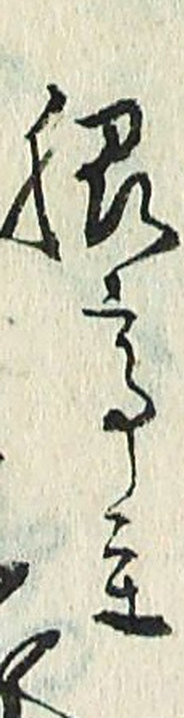脇亭主
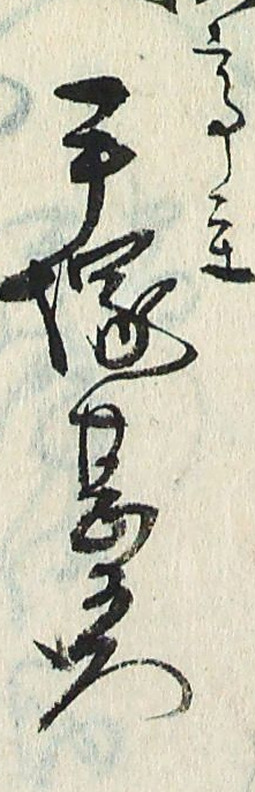手塚甚右衛門
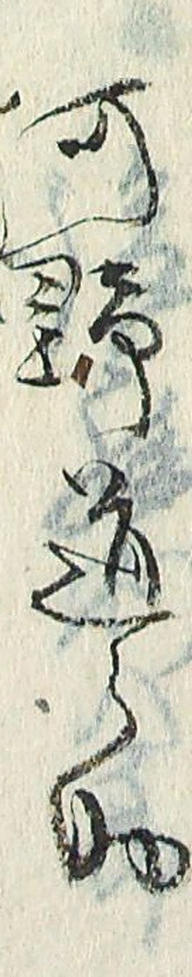河野道之助
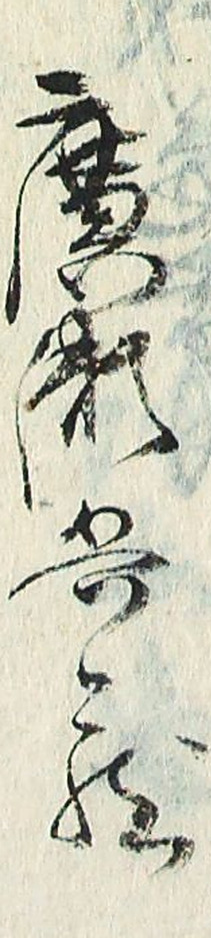広瀬兵蔵
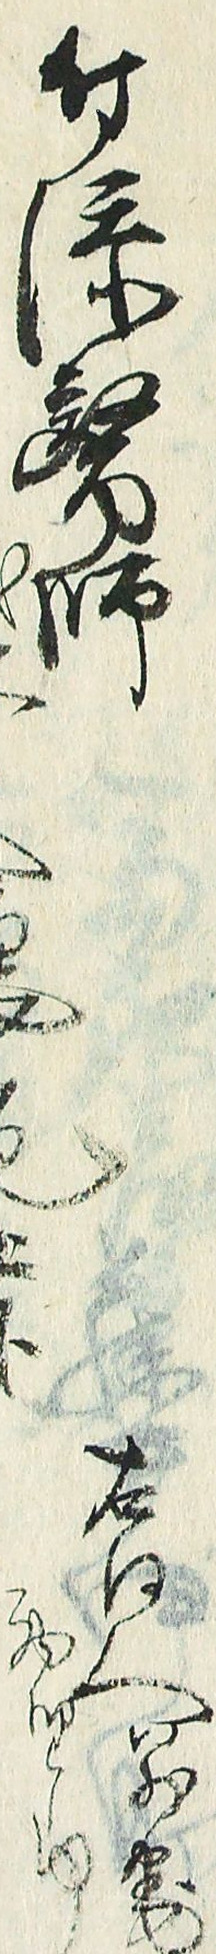付添医師右同人別宅
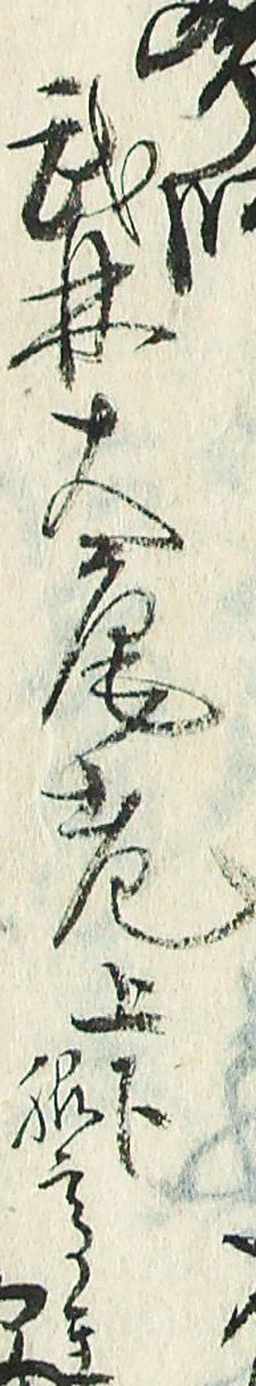武林大庵老上下西助郎
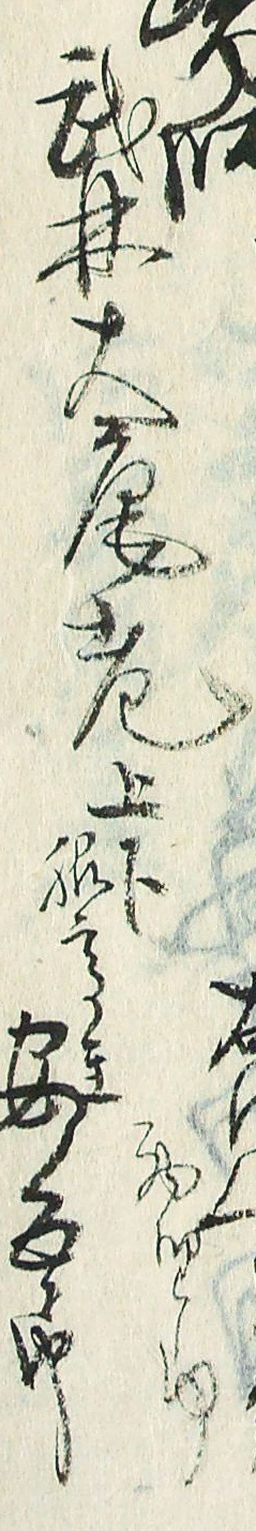武林大庵老上下西助郎
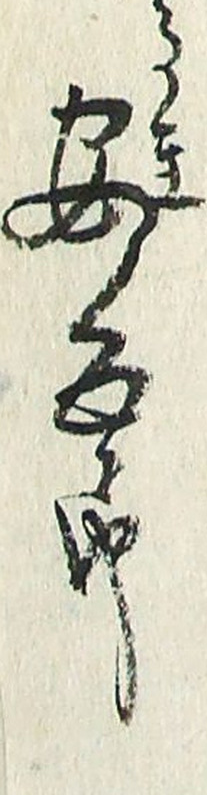安五郎

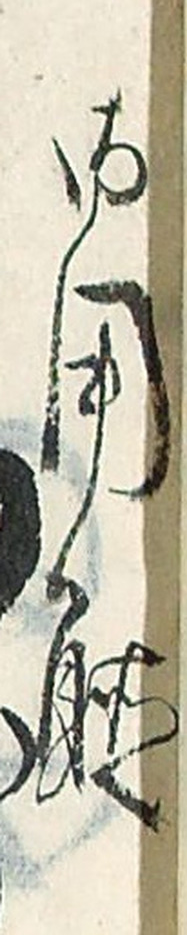御用聴
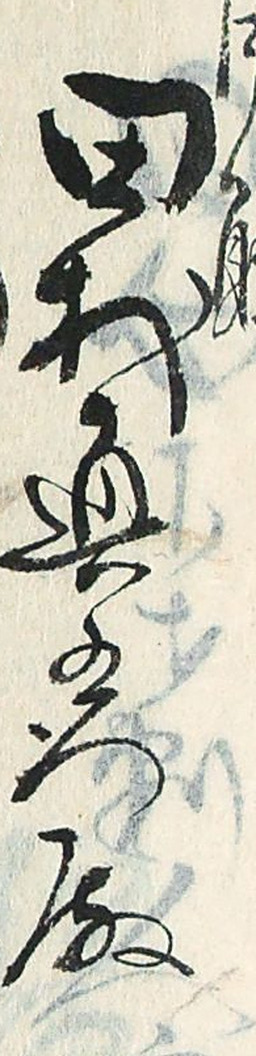田村真右衛門殿
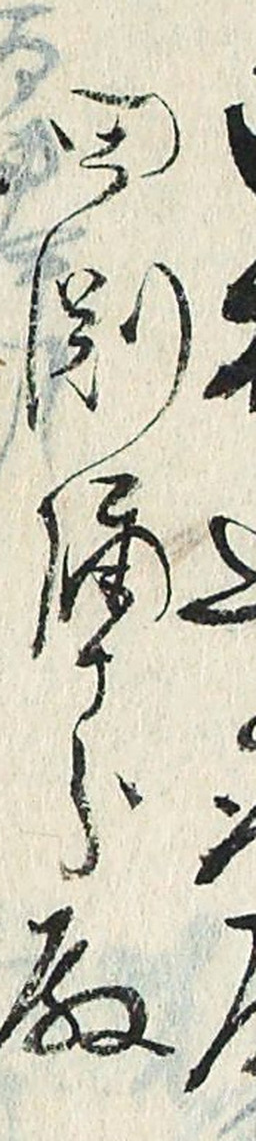田淵弥十郎殿宿
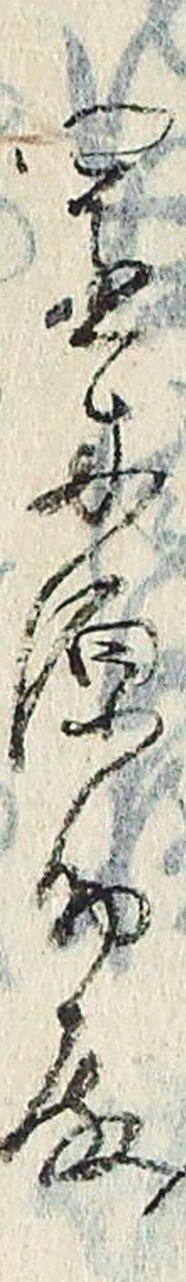園木源助殿
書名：公辺御役人為御廻浦御立越諸御用一巻
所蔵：鳴門教育大学 Naruto University of Education
